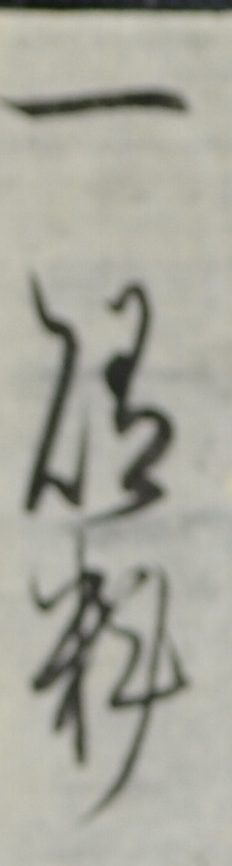一賄料
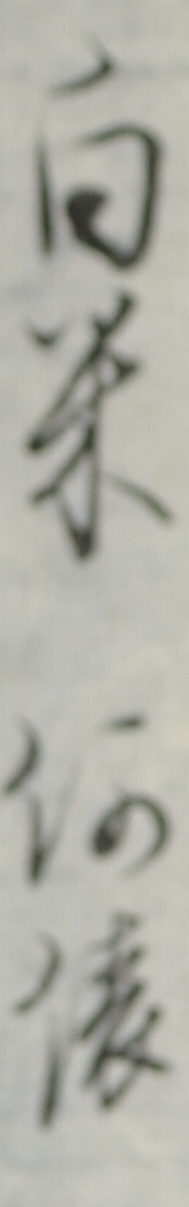白米何俵
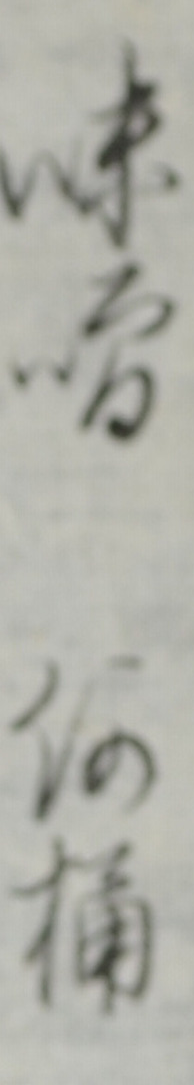味噌何桶
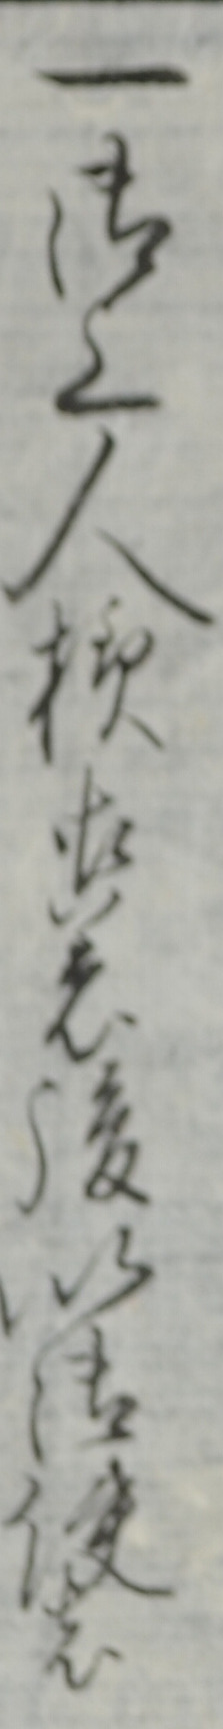一御上人様御着後以御使者
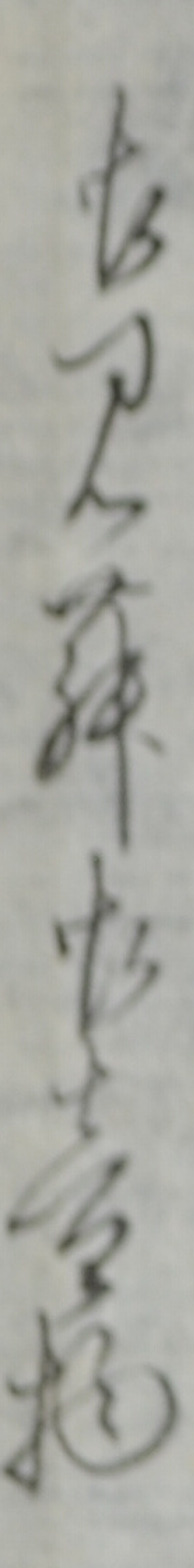御見舞御音物
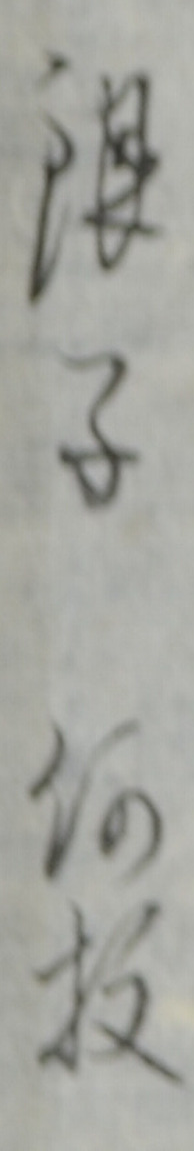銀子何枚
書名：（書状）
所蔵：伊那市立高遠町図書館・合同会社AMANE
